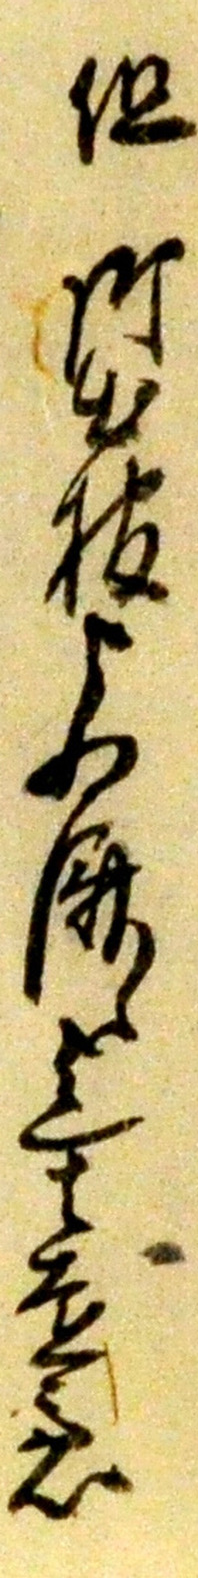但御出棺被為済候迄者遠慮
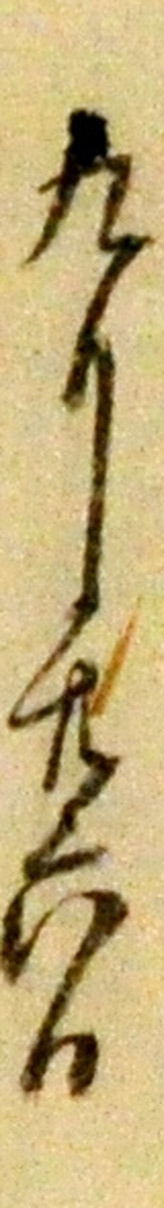九月廿六日
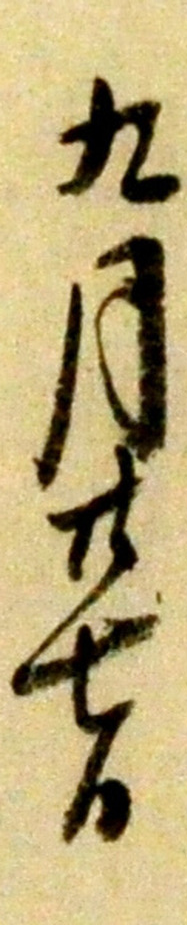九月廿七日
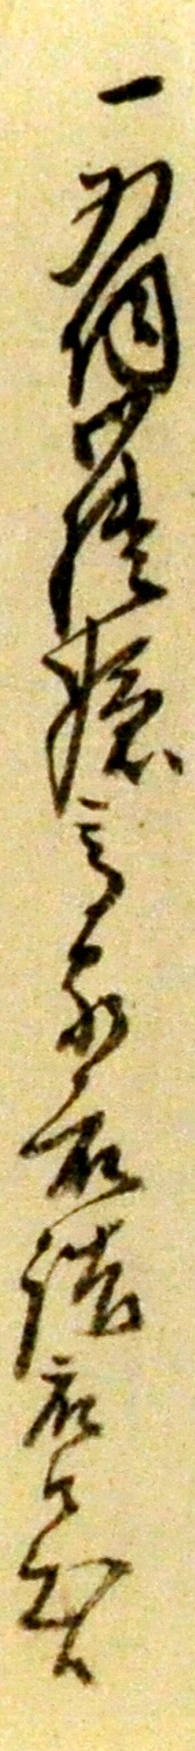一為伺御機嫌高家衆詰衆候出ス
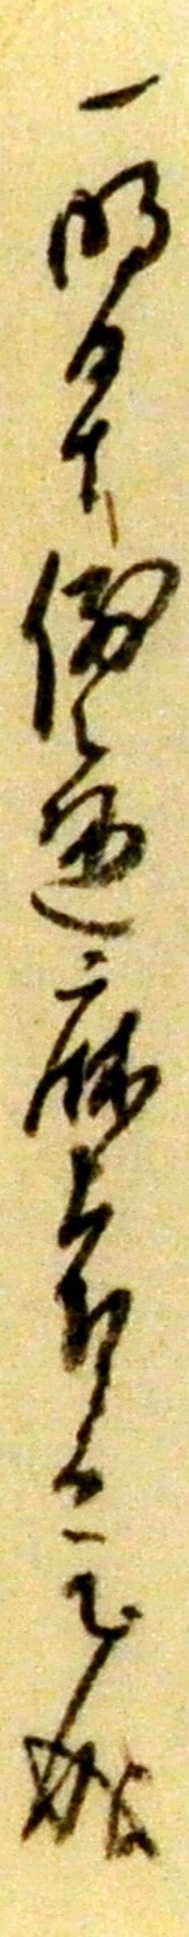一明日者例之通麻上下ニ而可被成
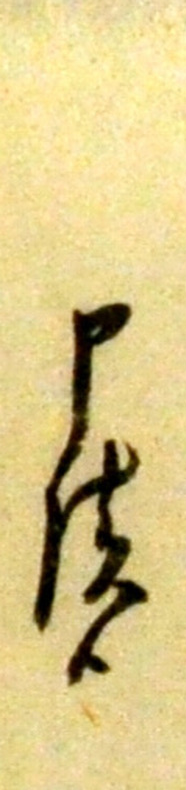申談候
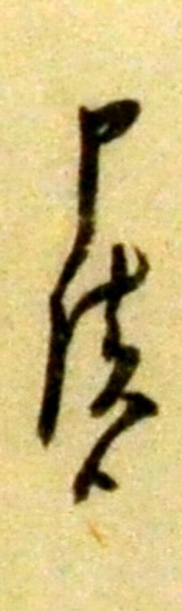申談候
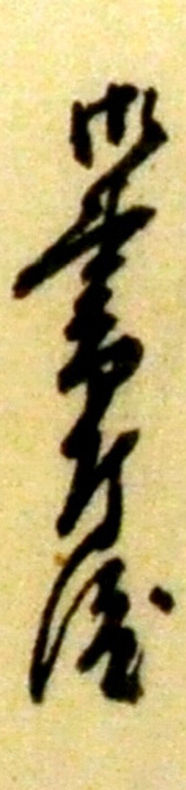御書付渡
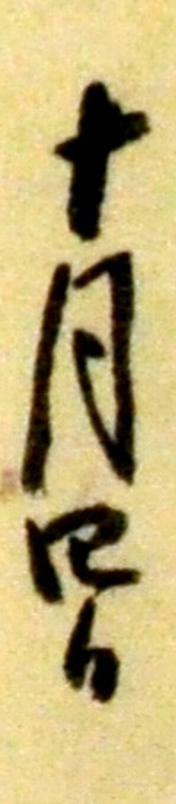十月四日
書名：書抜
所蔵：伊那市立高遠町図書館・合同会社AMANE
